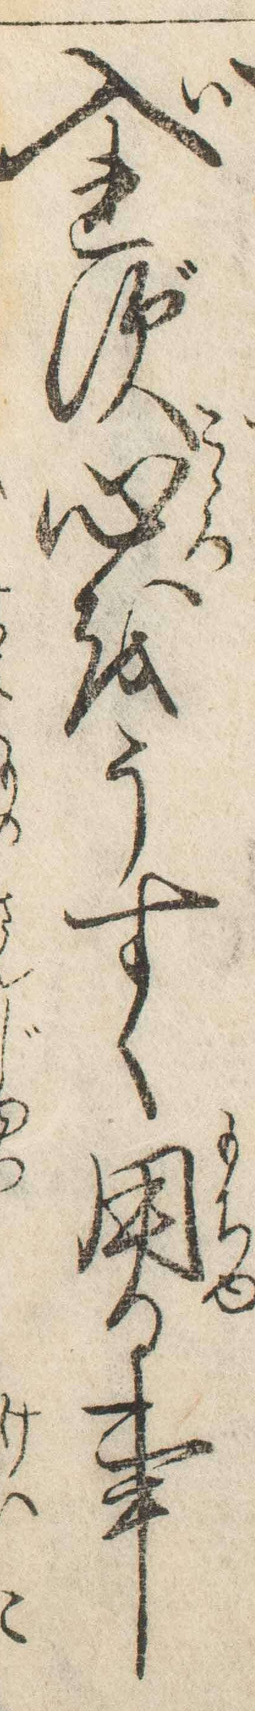入れず心をうすく用る事
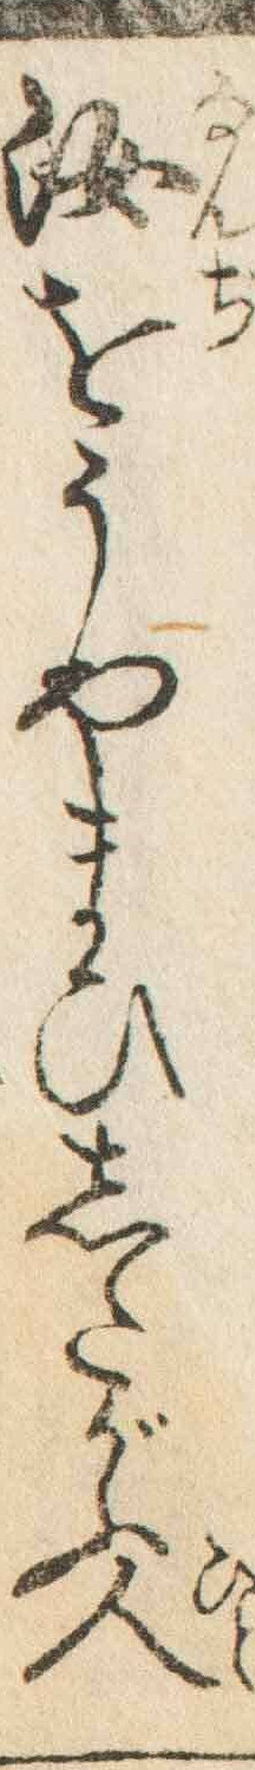汝をうやまひしたがふ人
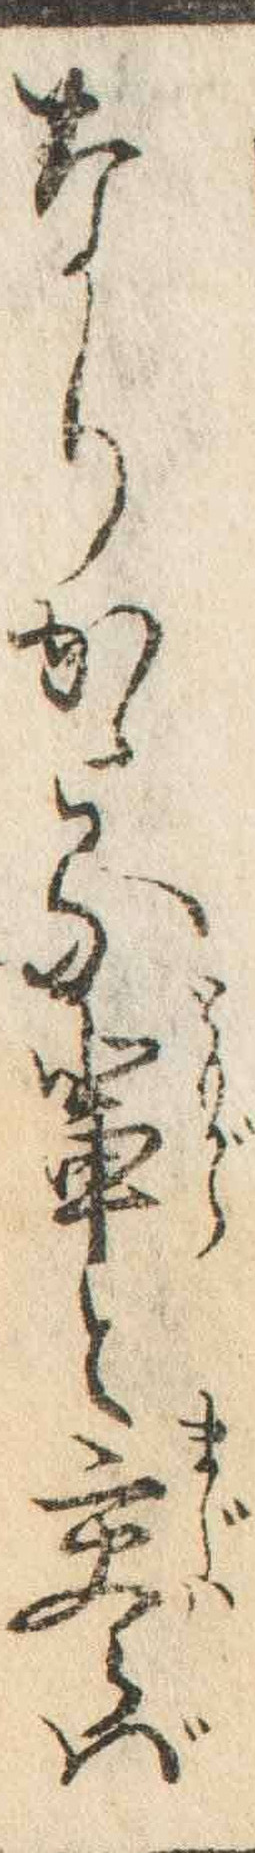なりかゝる輩と交らば
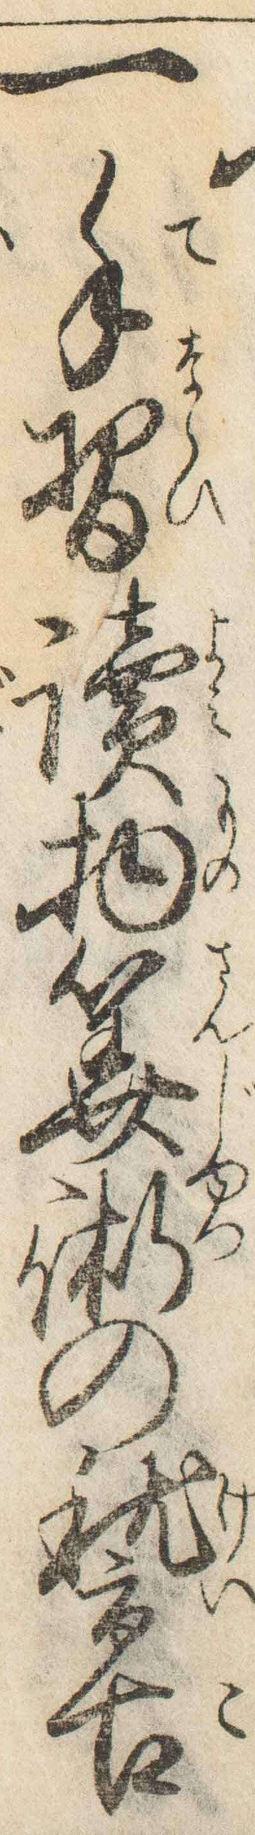一手習読物算術の稽古
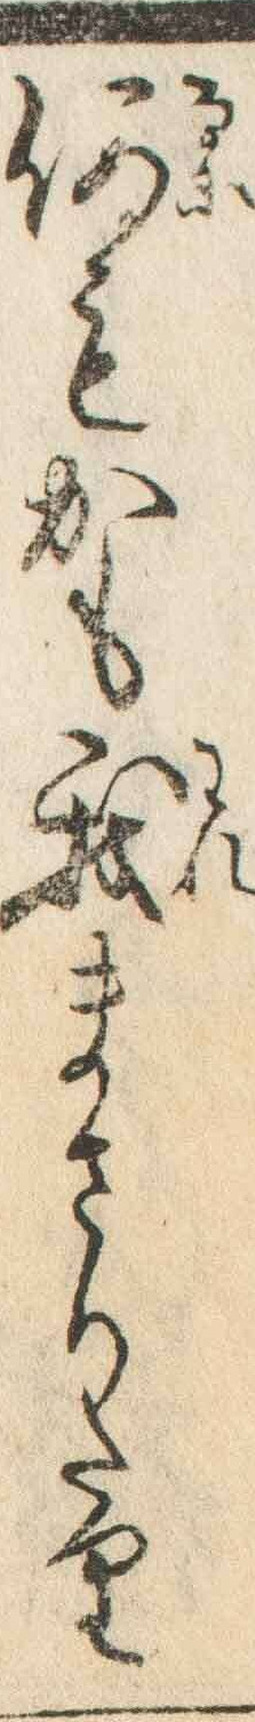何もかも我まさりたり
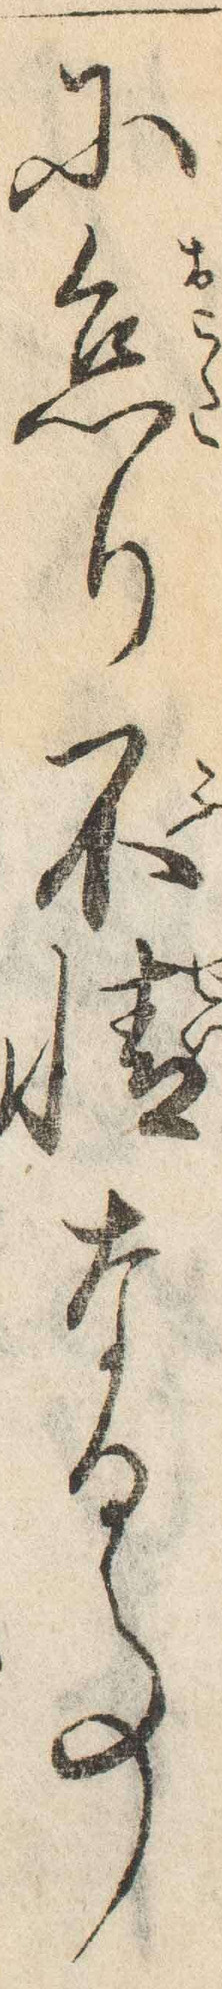に怠り不精なる事
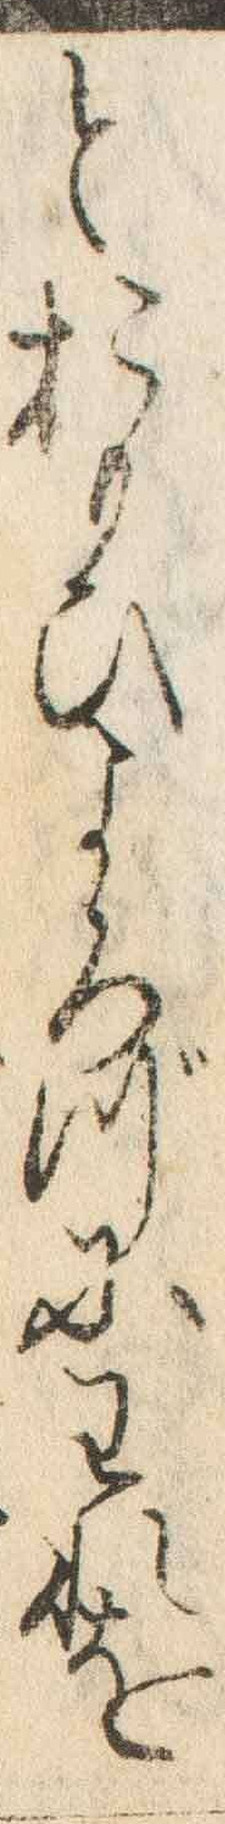とおもひよろづにわれを
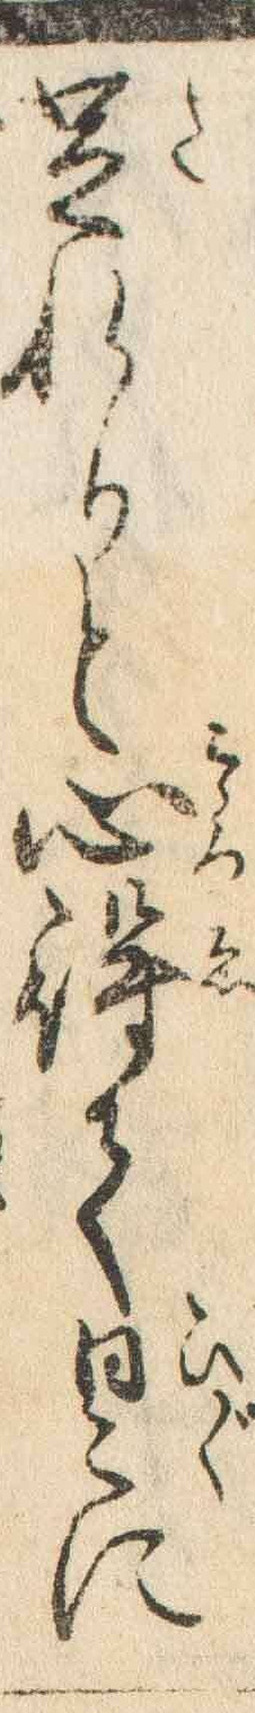足れりと心得て日々に
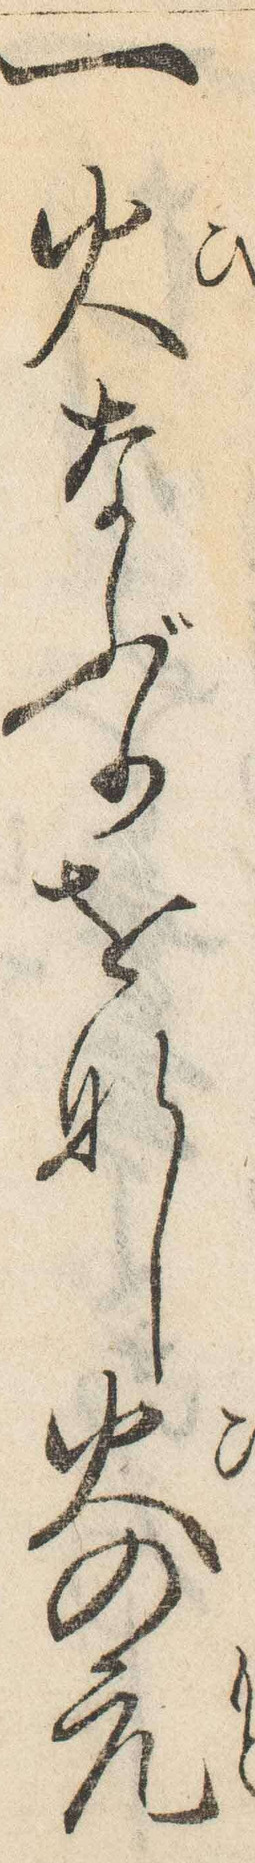一火なぶるをなし火の元
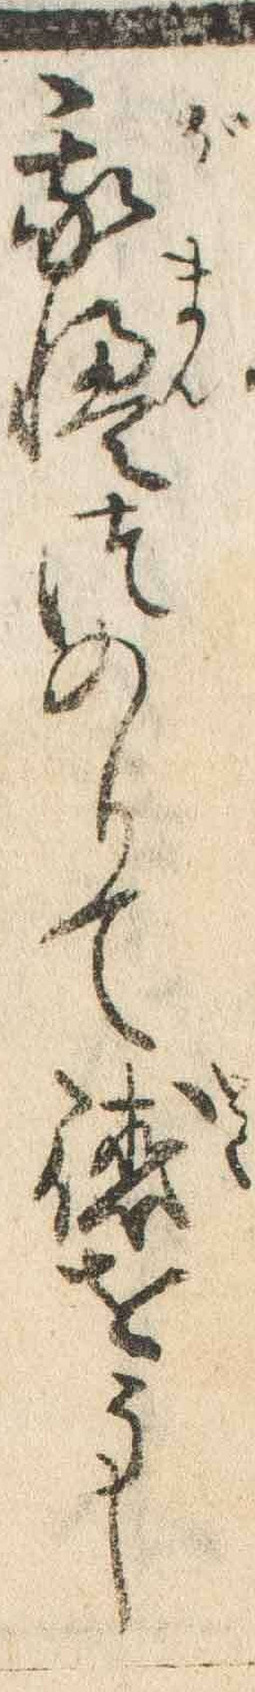我慢つのりて徳をうし
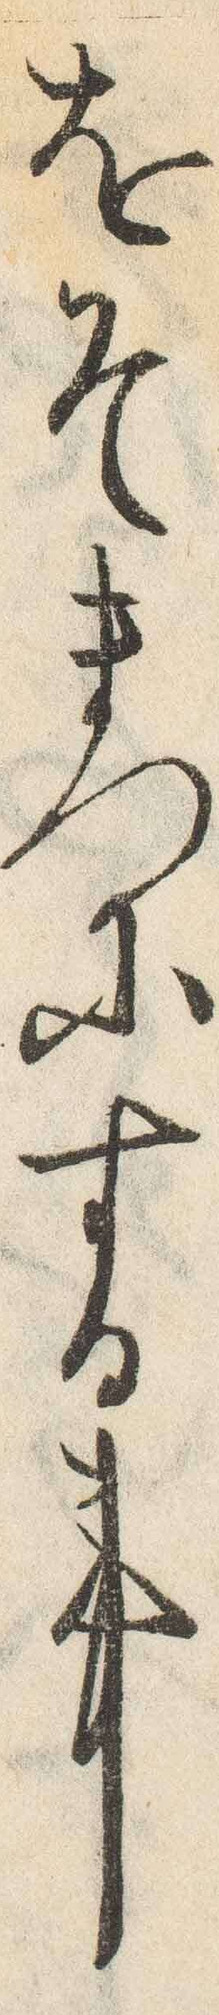をそまつにする事
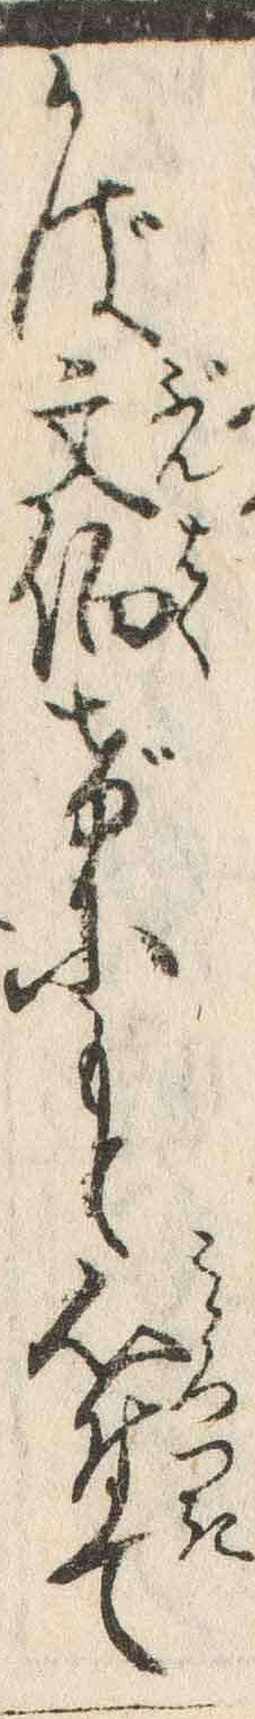かば文伯げにもと心付て
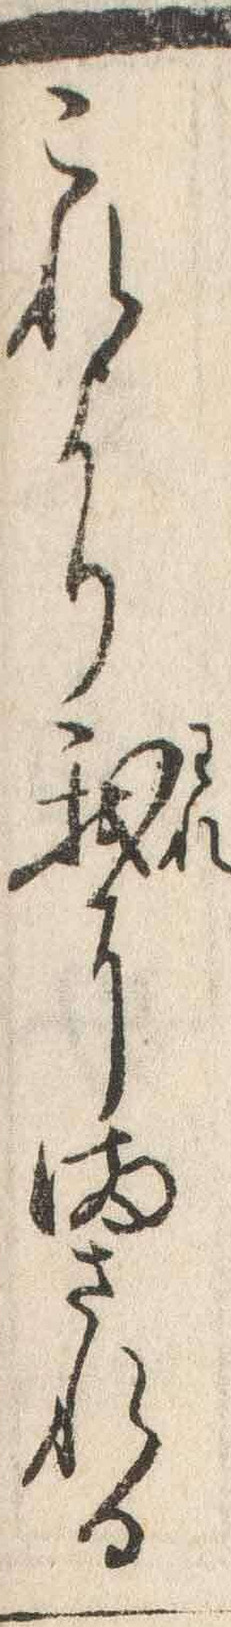これより我にまされる
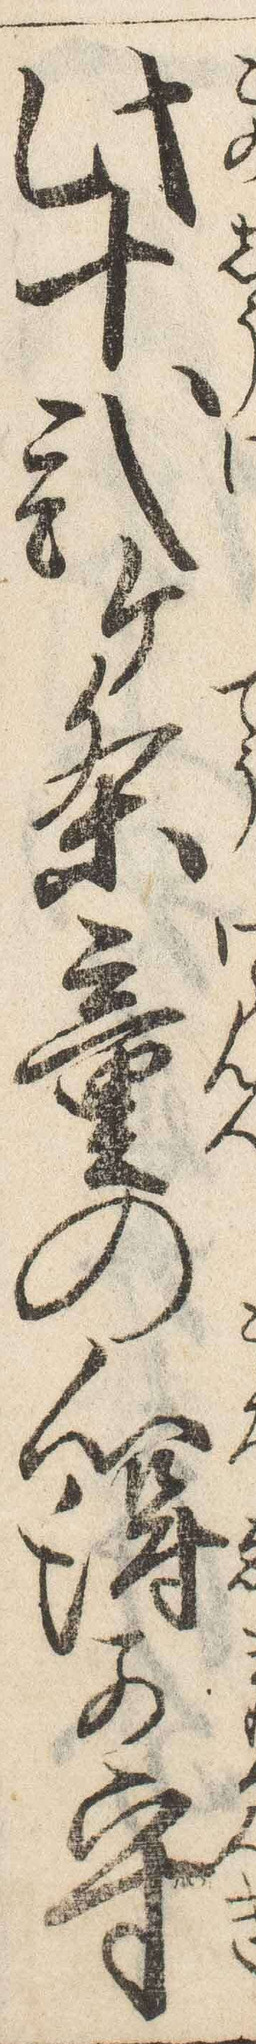此十弐ヶ条童の心得可守
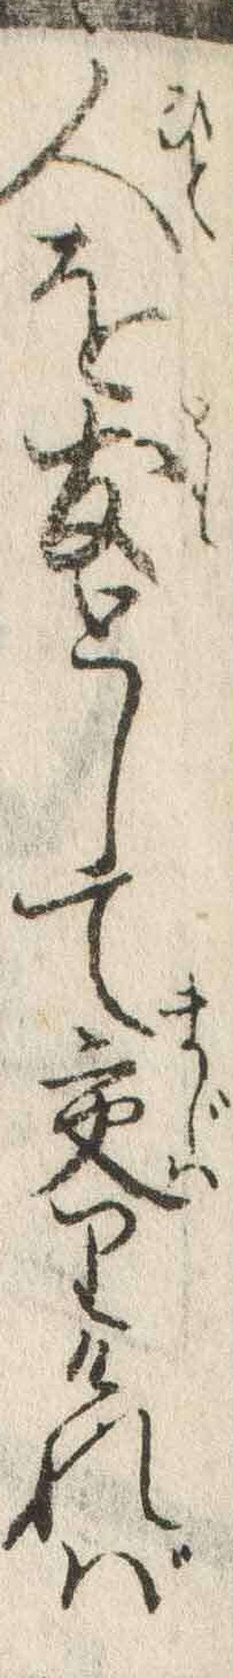人を友として交りければ
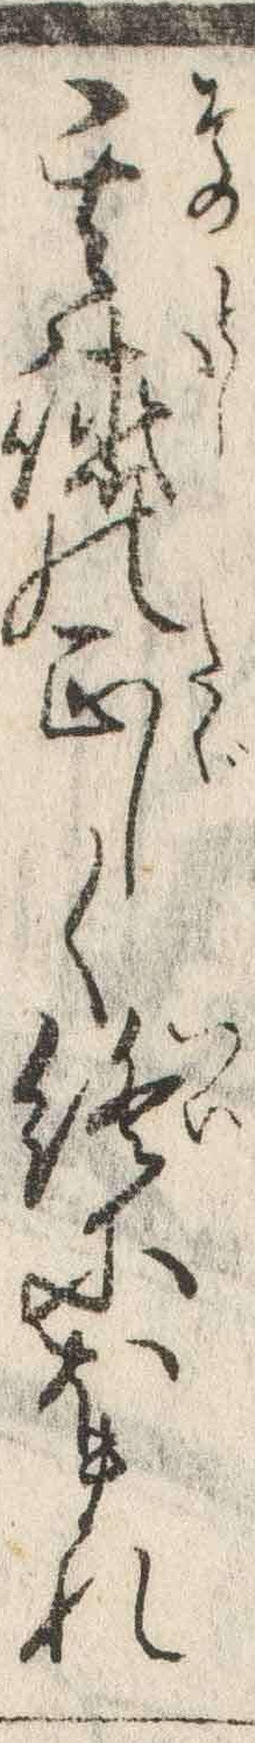其徳の正しく終にほまれ
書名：撫育草
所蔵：東京学芸大学附属図書館 国文学研究資料館
